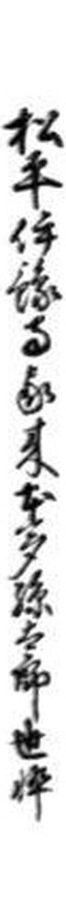松平伊予守家来本多孫太郎世忰
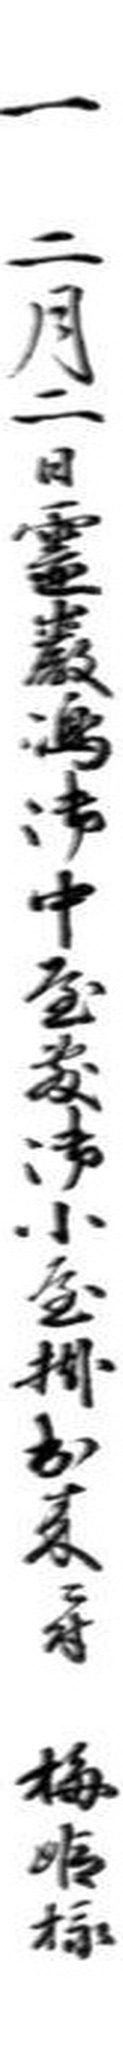一二月二日霊厳嶋御中屋敷御小屋掛出来ニ付梅姫様
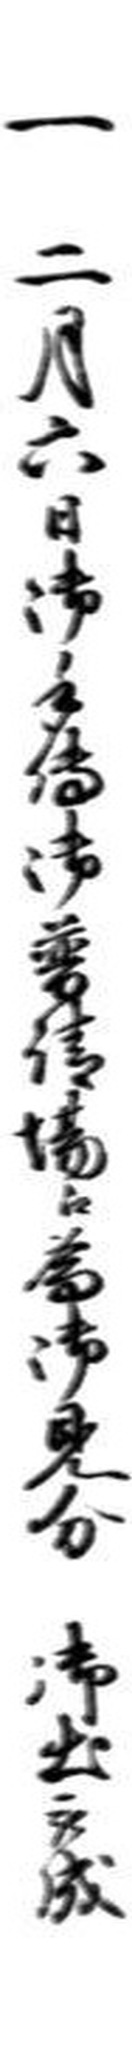一二月六日御手伝御普請場江為御見分御出被成
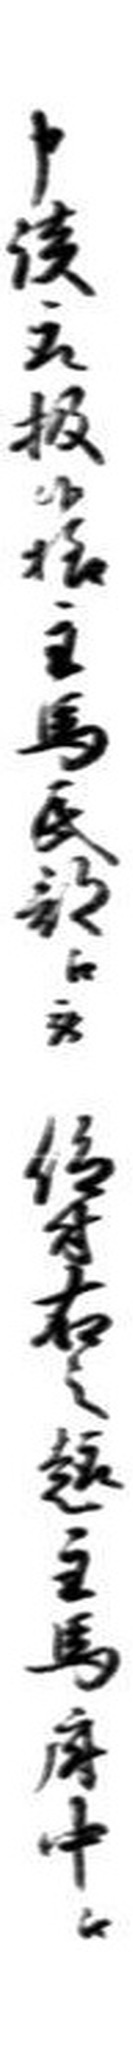申談取扱候様主馬民部江被仰付右之趣主馬府中江
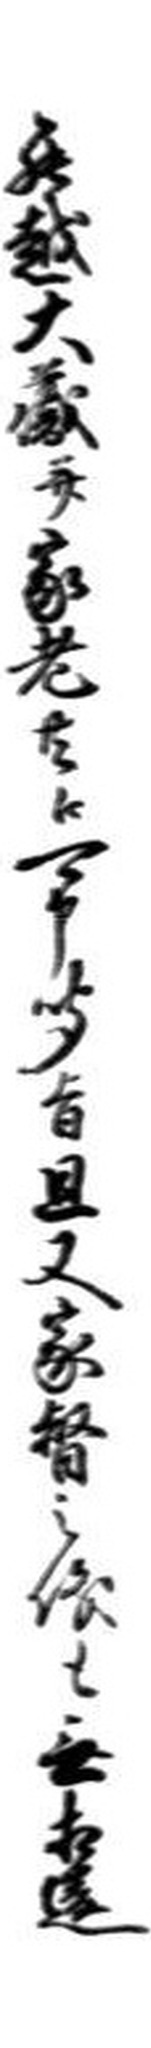罷越大蔵并家老共江可申聞旨且又家督之儀も無相違
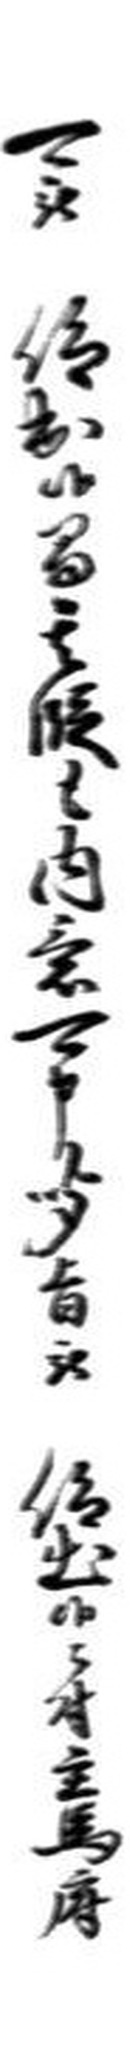可被仰出候間其段も内意可申聞旨被仰出候ニ付主馬府
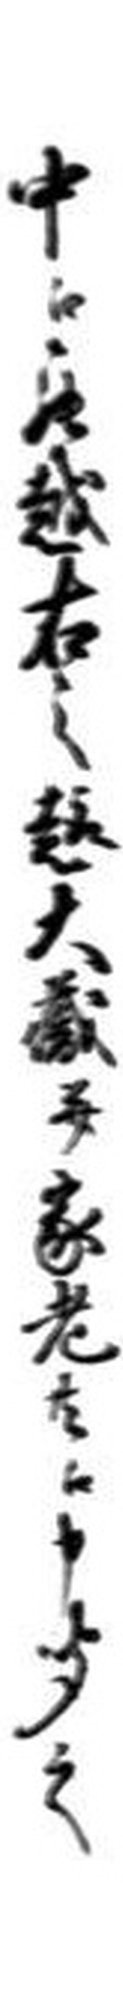中江罷越右之趣大蔵并家老共江申聞之

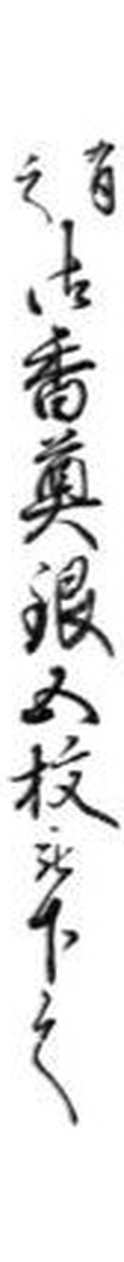之御香奠銀五枚被下之
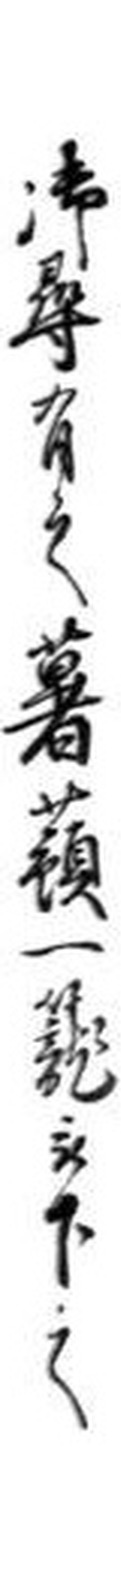御尋有之薯蕷一籠被下之
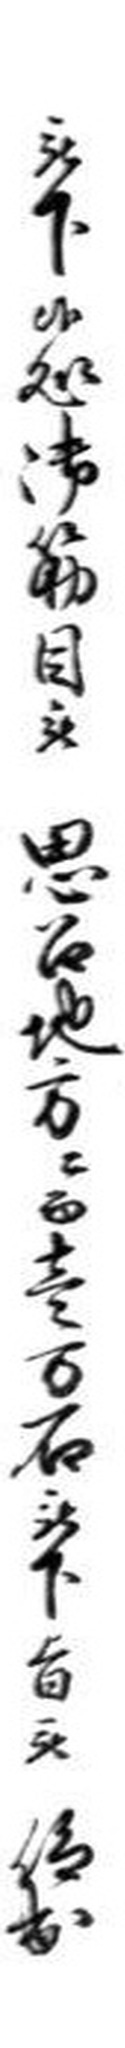被下候処御筋目被思召地方ニ而壱万石被下旨被仰出
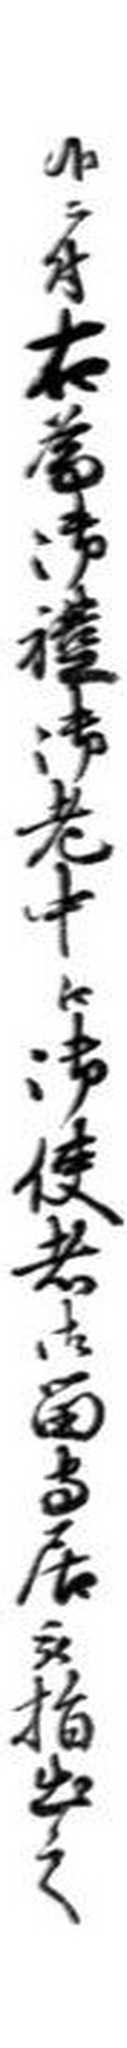候ニ付右為御礼御老中江御使者御留守居被指出之
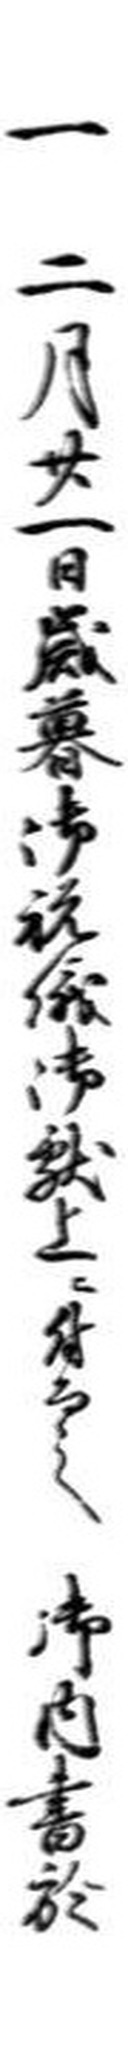一二月廿一日歳暮御祝儀御献上ニ付而之御内書於
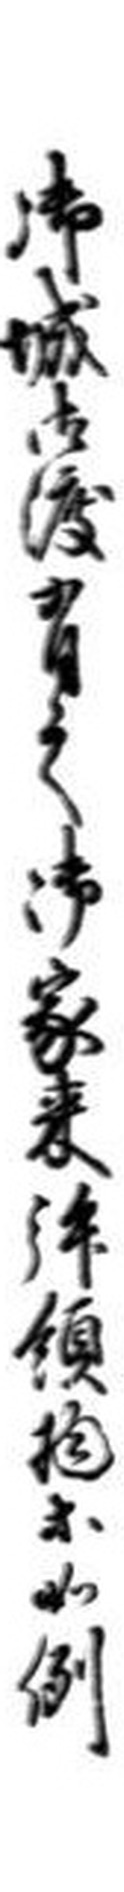御城御渡有之御家来拝領物等如例
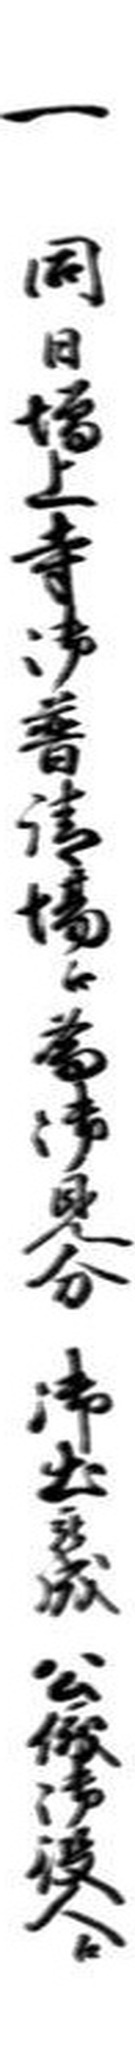一同日増上寺御普請場江為御見分御出被成公儀御役人江
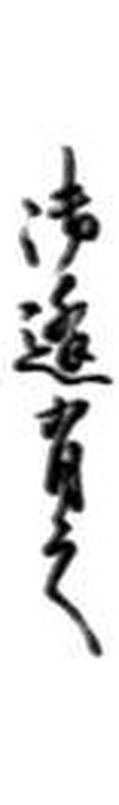御逢有之
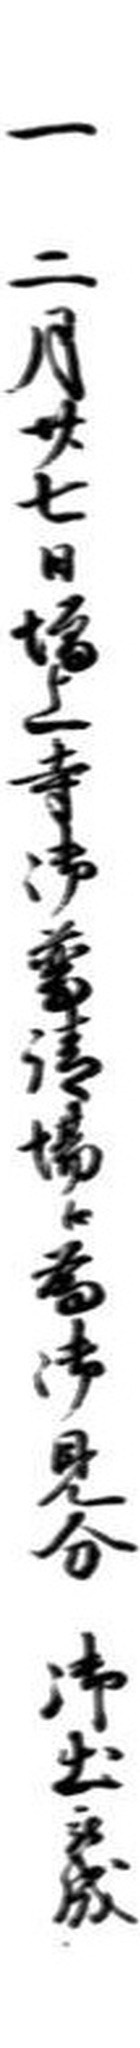一二月廿七日増上寺御普請場江為御見分御出被成
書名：家譜 三十二 吉邦公 従享保二年到享保三年
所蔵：福井県文書館 Fukui Prefectural Archives
